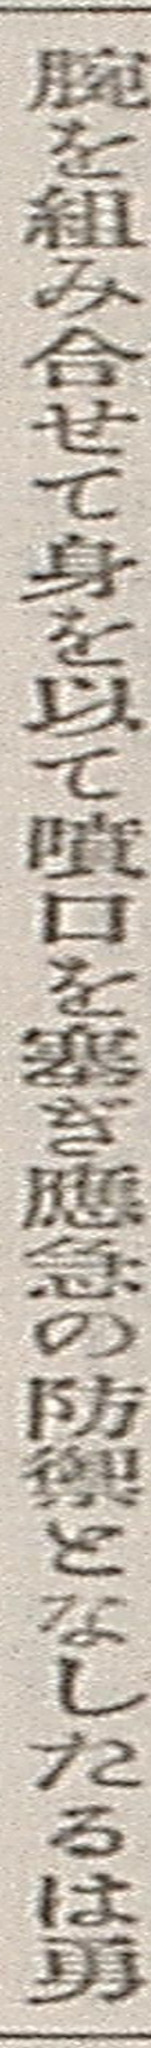腕を組み合せて身を以て噴口を塞ぎ応急の防禦となしたるは勇
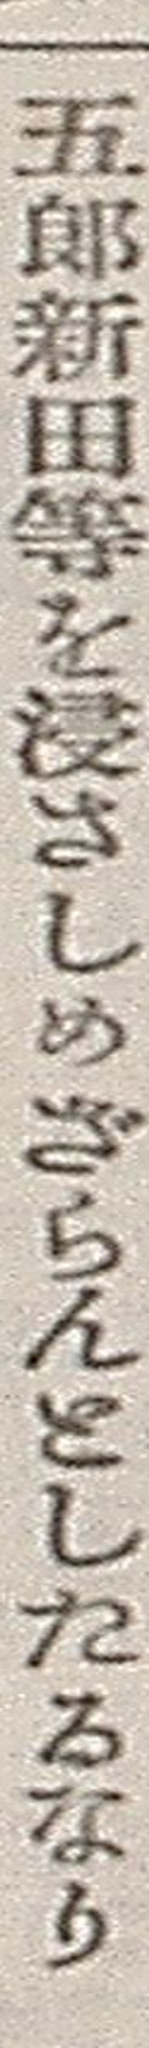五郎新田等を浸さしめざらんとしたるなり
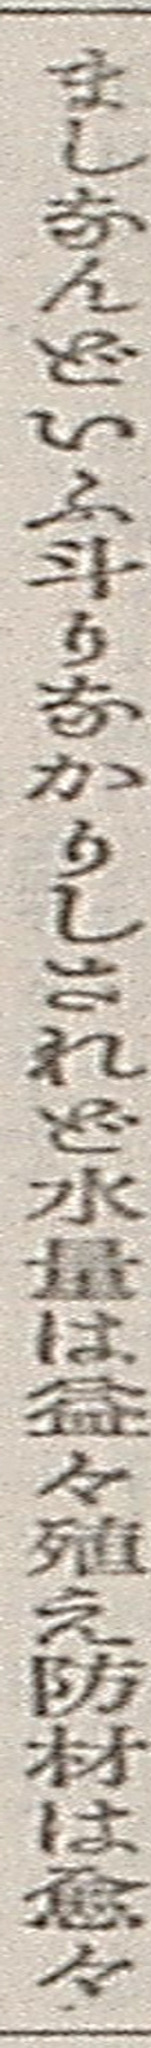ましなんどといふ斗りなかりしされど水量は益々殖え防材は愈々
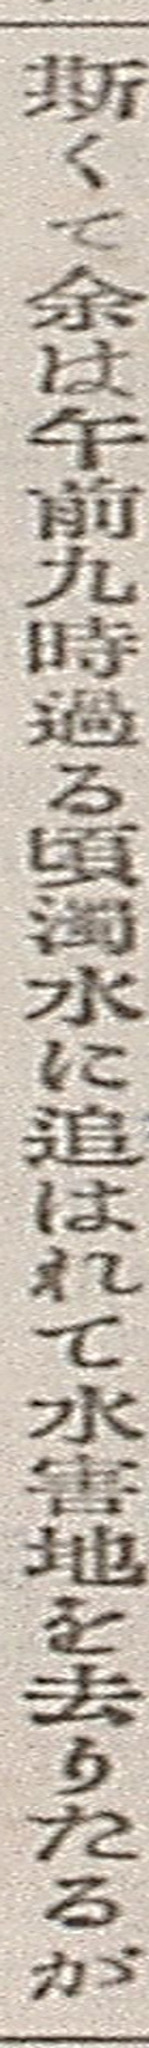斯くて余は午前九時過る頃濁水に追はれて水害地を去りたるが
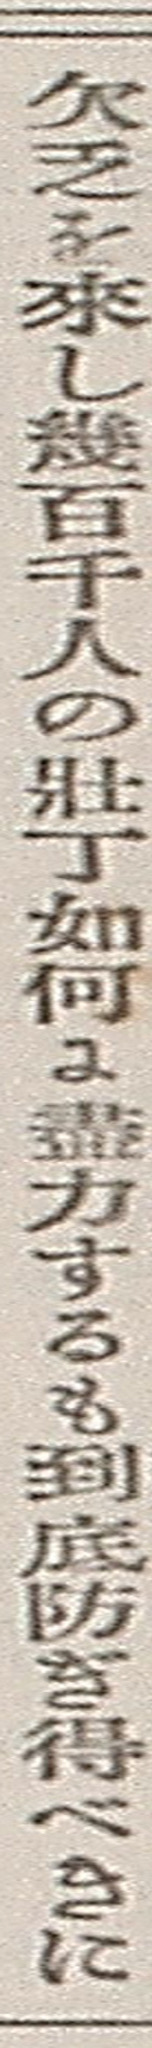欠乏を来し幾百千人の壮丁如何に尽力するも到底防ぎ得べきに
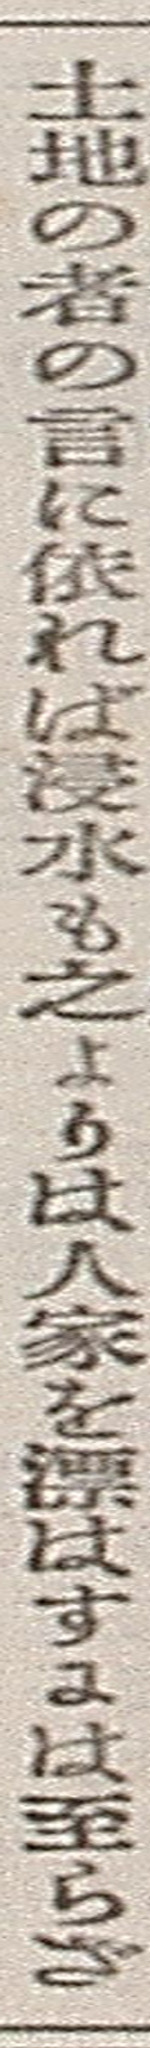土地の者の言に依れば浸水も之よりは人家を漂はすには至らざ
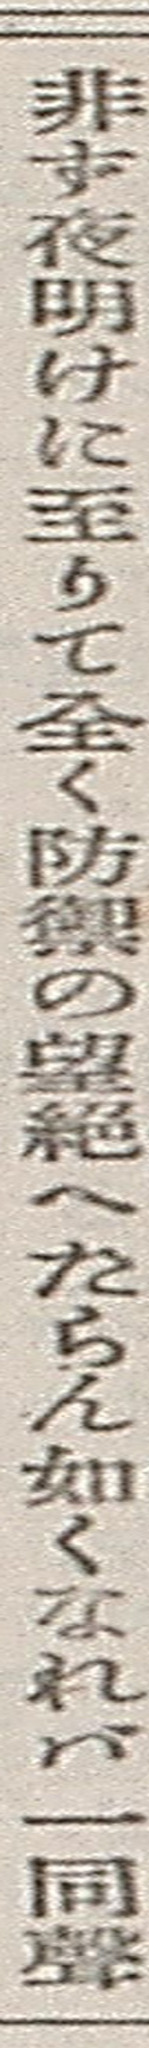非ず夜明けに至りて全く防禦の望絶へたらん如くなれば一同声
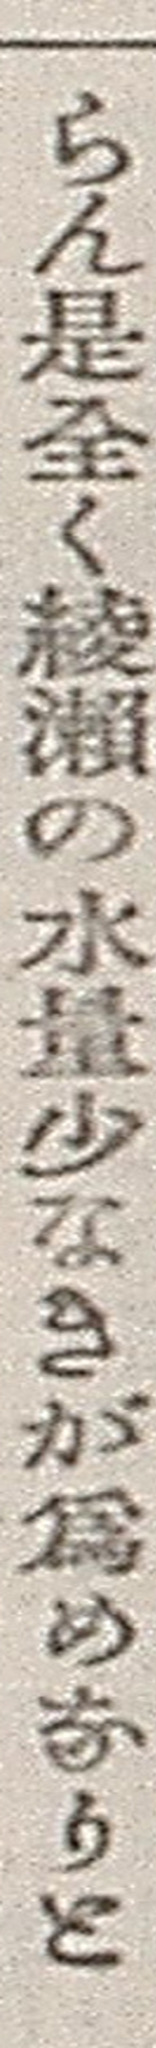らん是全く綾瀬の水量少なきが為めなりと
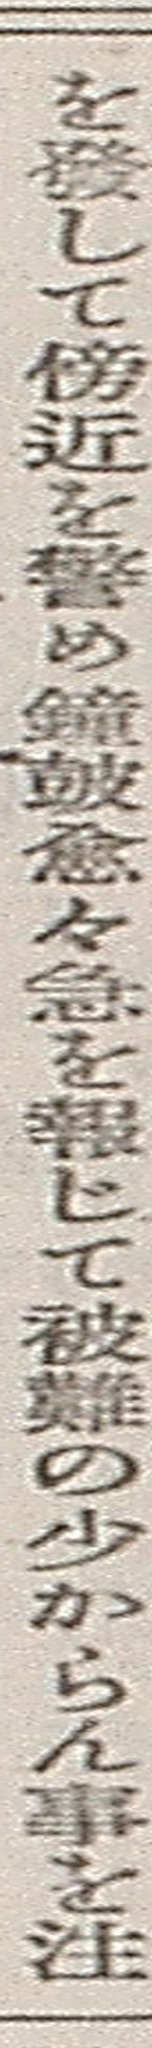を発して傍近を警め鐘鼓愈々急を報じて被難の少からん事を注
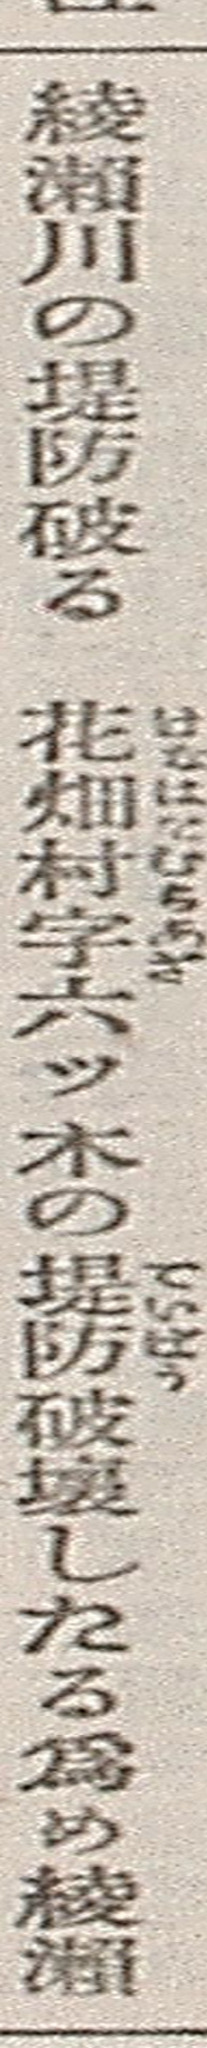綾瀬川の堤防破る花畑村字六ツ木の堤防破壊したる為め綾瀬
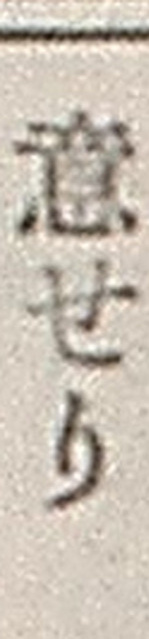意せり
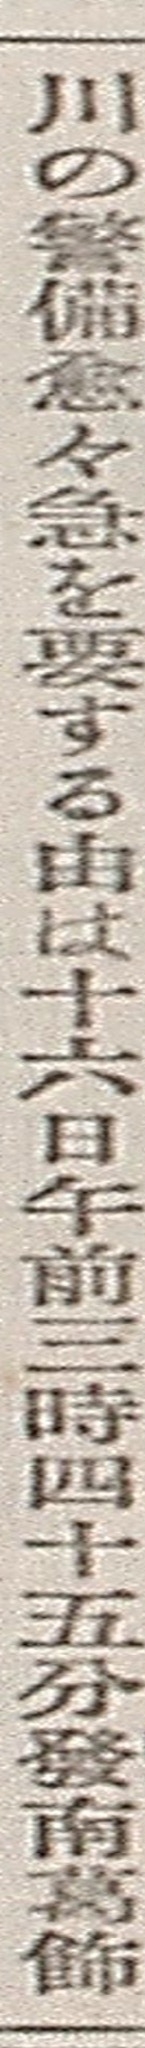川の警備愈々急を要する由は十六日午前三時四十五分発南葛飾
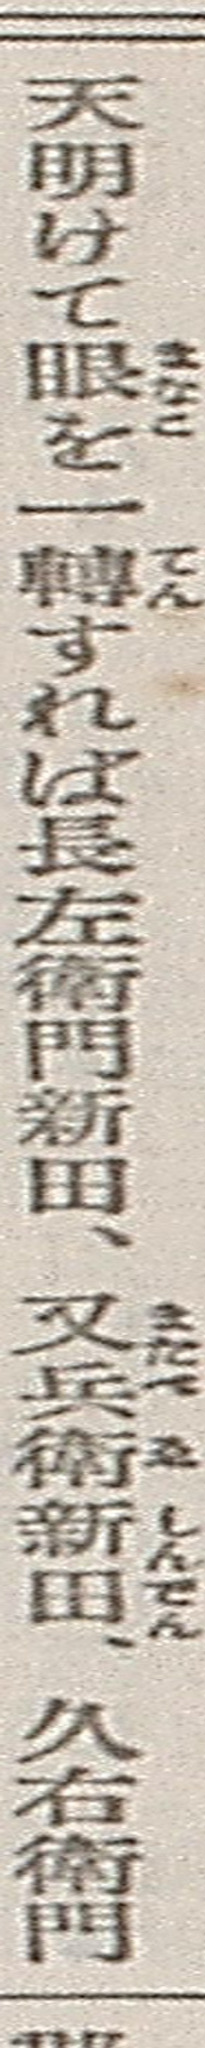天明けて眼を一転すれば長左衛門新田、又兵衛新田、久右衛門
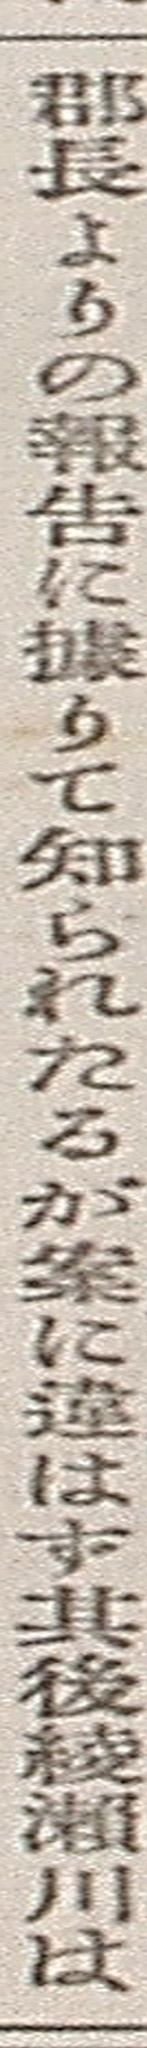郡長よりの報告に拠りて知られたるが案に違はず其後綾瀬川は
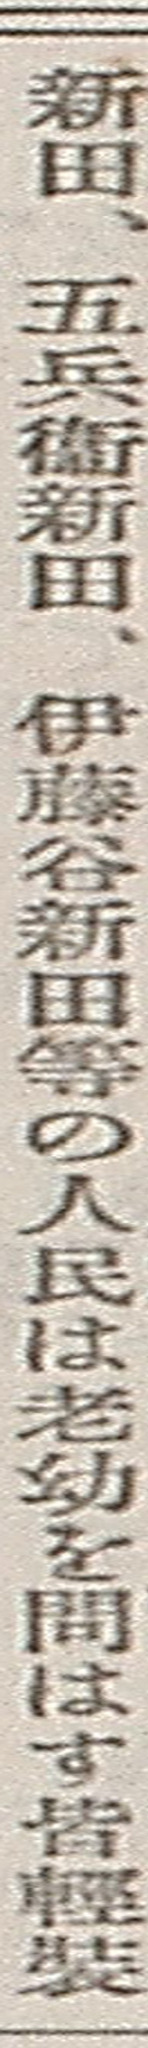新田、五兵衛新田、伊藤谷新田等の人民は老幼を問はず皆軽装
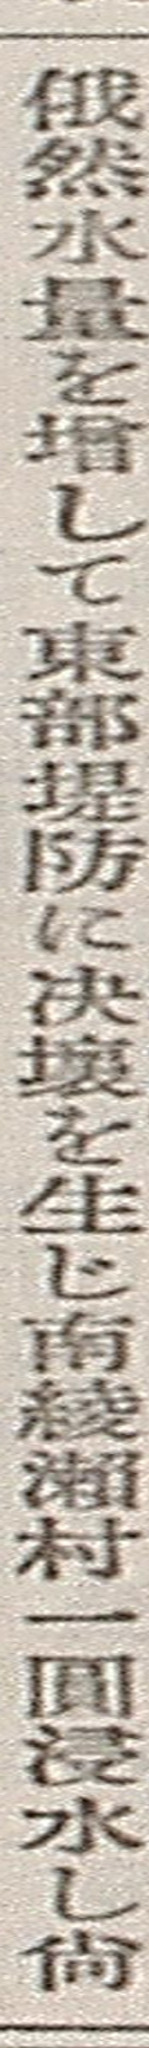俄然水量を増して東部堤防に決壊を生じ南綾瀬村一円浸水し尚
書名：風俗畫報臨時増刊第百二十四號　洪水地震被害録（上）
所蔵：東京大学地震研究所図書室 Earthquake Research Institute Library, The University of Tokyo, JAPAN
